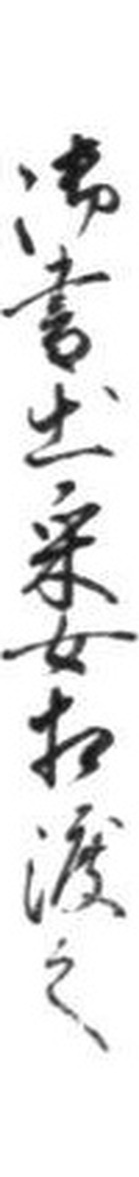御書出采女相渡之
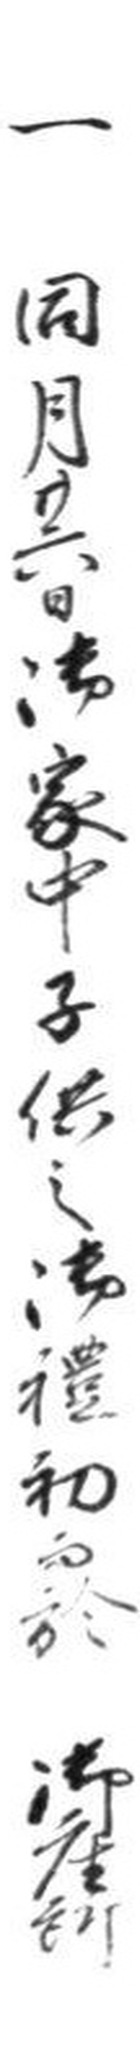一同月廿六日御家中子供之御礼初而於御座所
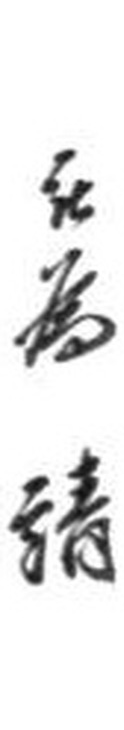被為請
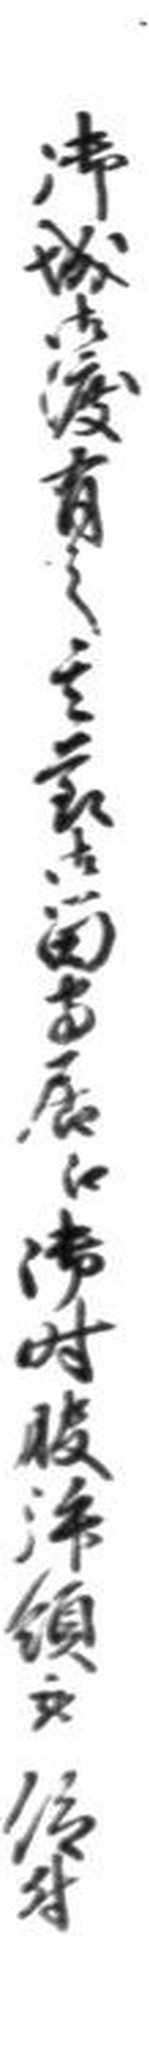御城御渡有之其節御留守居え御時服拝領被仰付
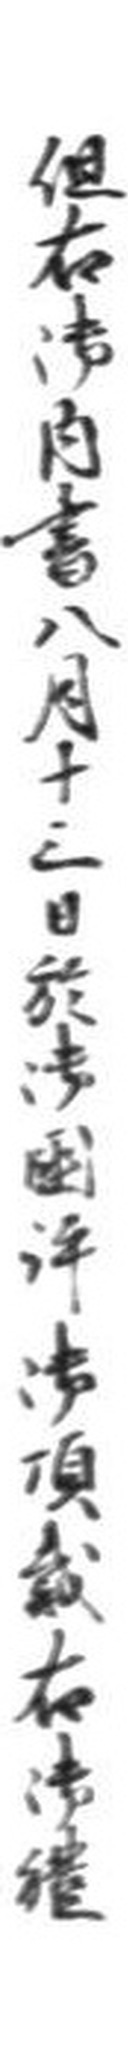但右御内書八月十三日於御国許御頂戴右御礼
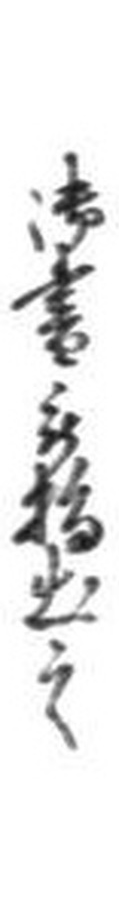御書被指出之
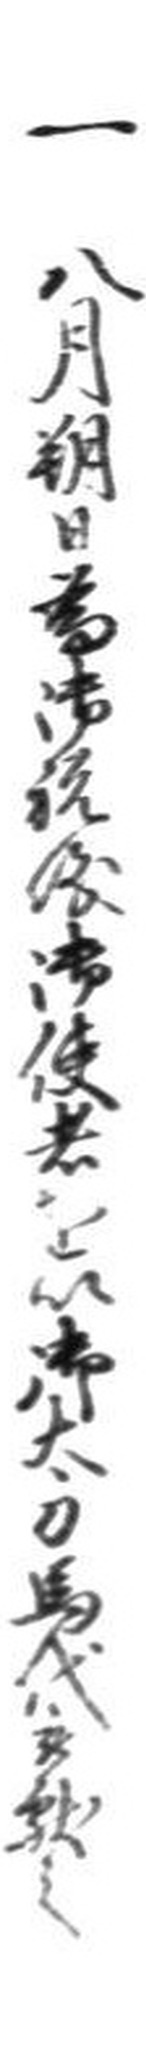一八月朔日為御祝儀御使者を以御太刀馬代被献之
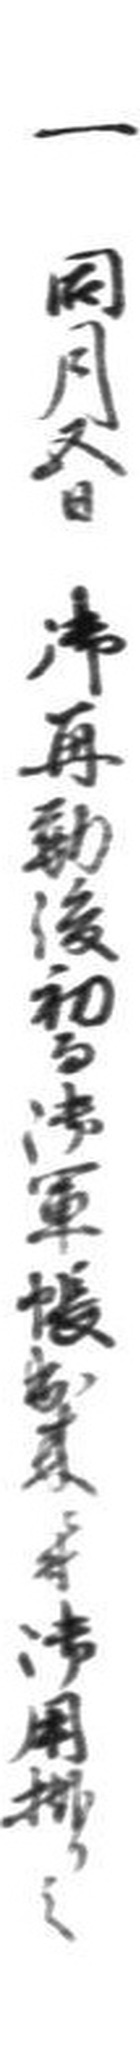一同月五日御再勤後初而御軍帳出来に付御用掛り之
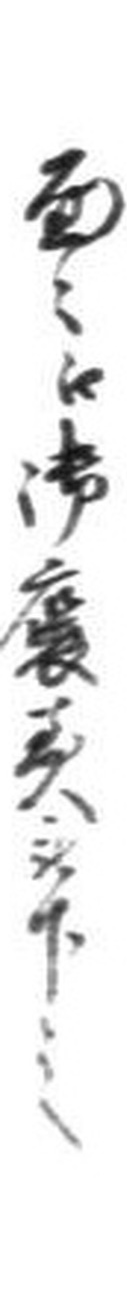面々江御褒美被下之
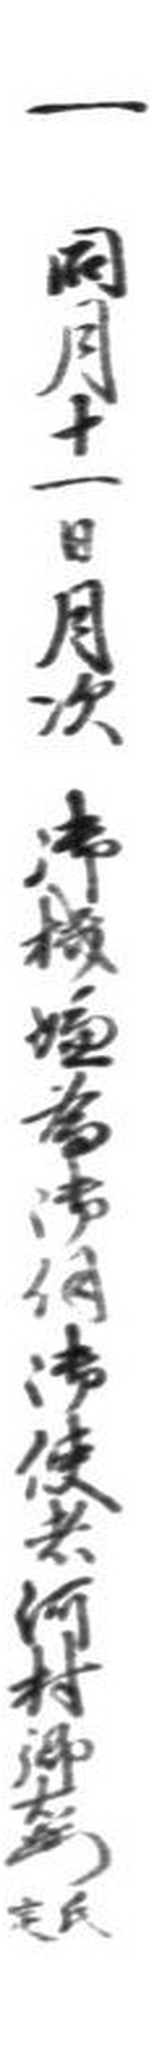一同月十一日月次御機嫌為御伺御使者河村郷右衛門氏定
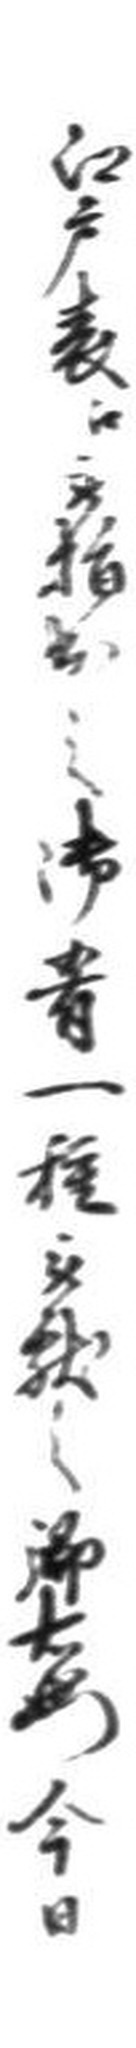江戸表江被指出之御肴一種被献之郷右衛門今日
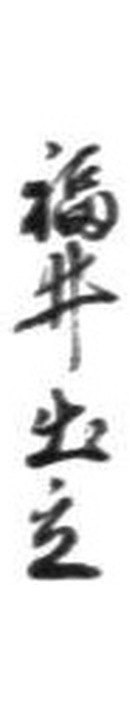福井出立

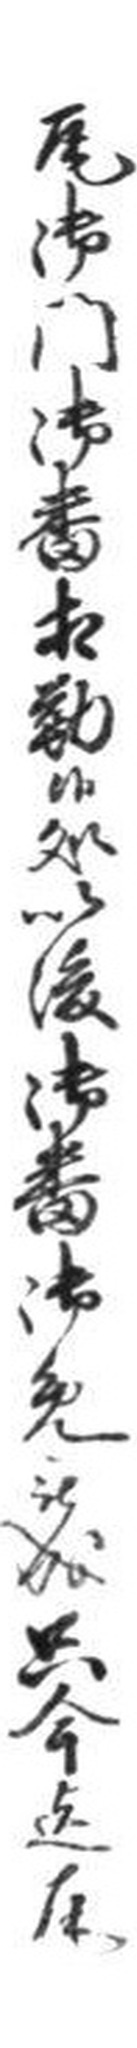瓦御門御番相勤候処以後御番御免被成只今迄瓦
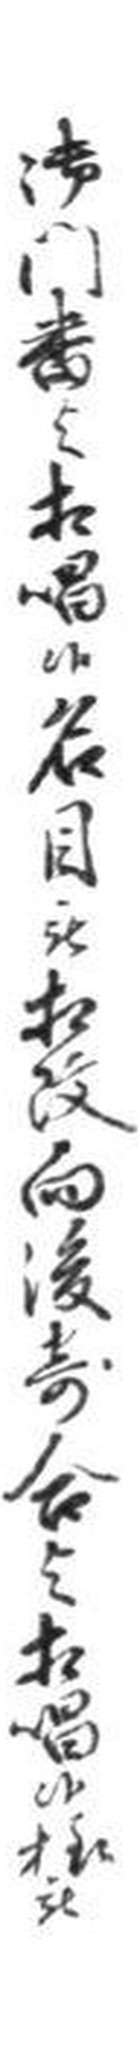御門番与相唱名目被相改向後寄合与相唱候様被
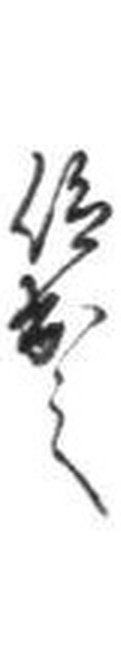仰出之
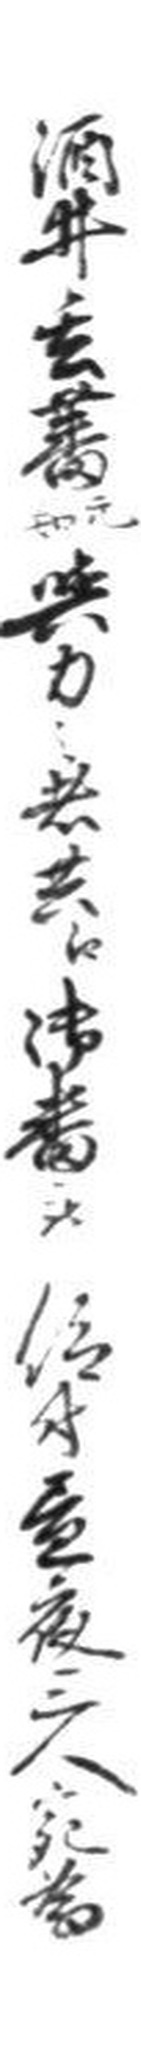酒井玄蕃元知与力之者共え御番被仰付昼夜三人宛為
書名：家譜 十六 吉品公 従貞享三年閏三月到同四年
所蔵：福井県文書館 Fukui Prefectural Archives
